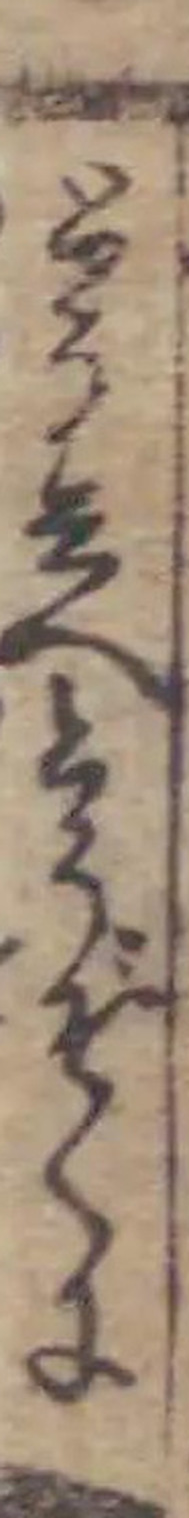とう兵へとうぞくに
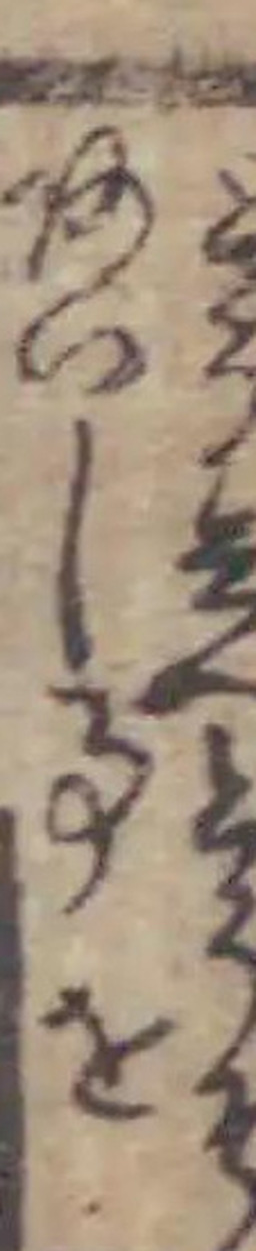あいし事を
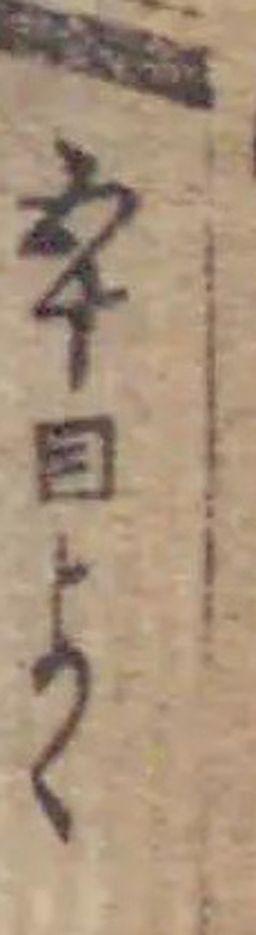五十目よく
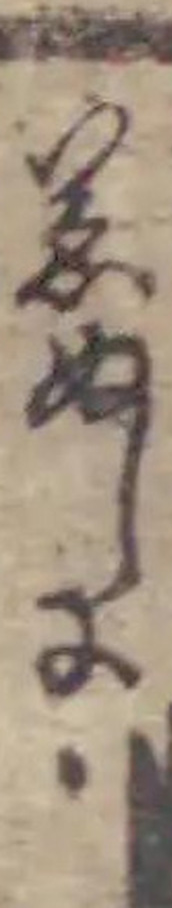いゑぬしに
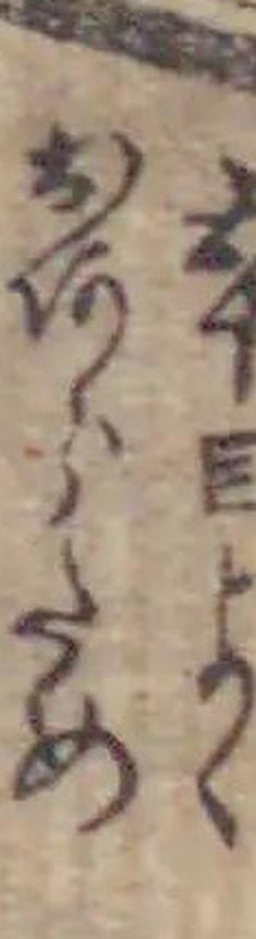おあらため
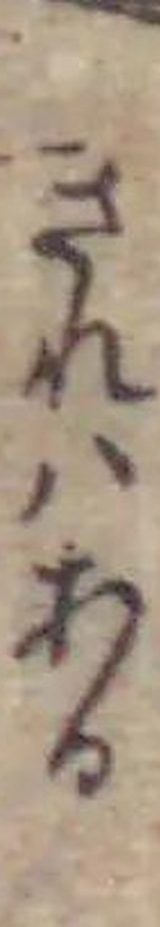きれはある
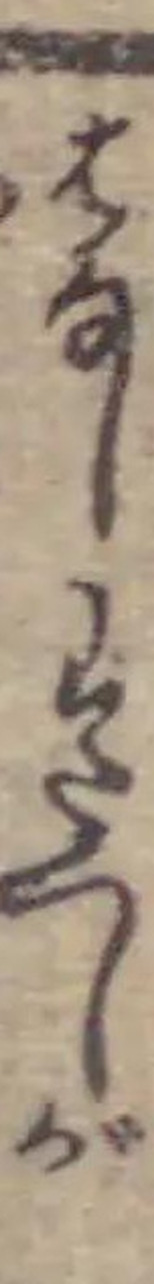はなしわたくしが
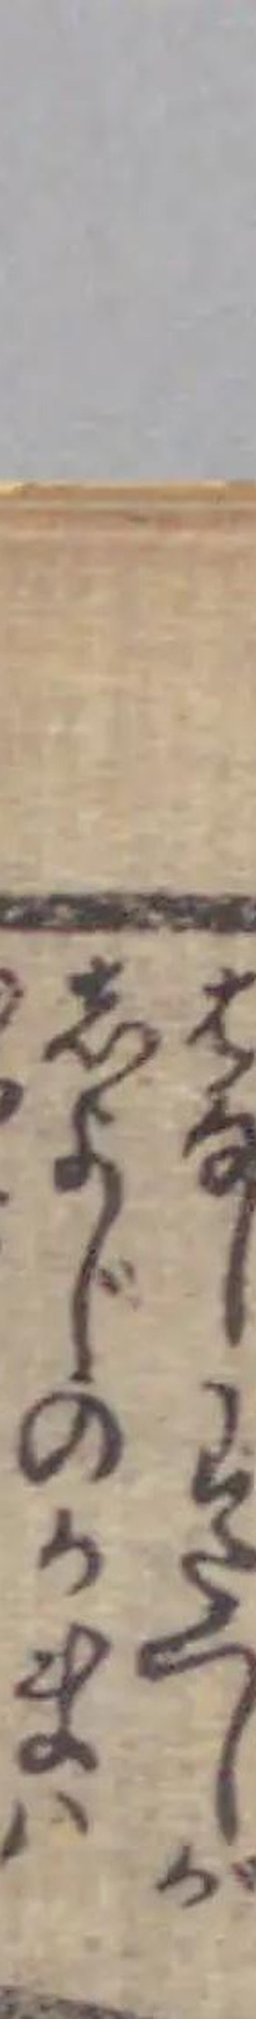しよじのかまは
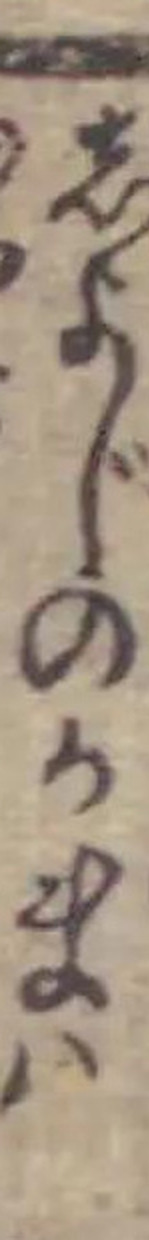しよじのかまは
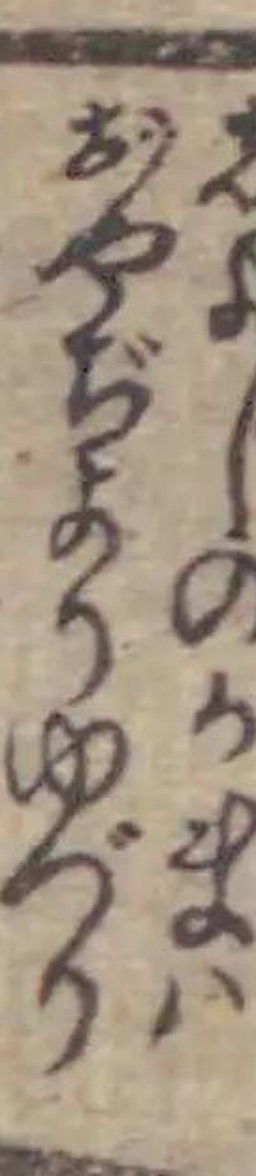おやぢよりゆづり
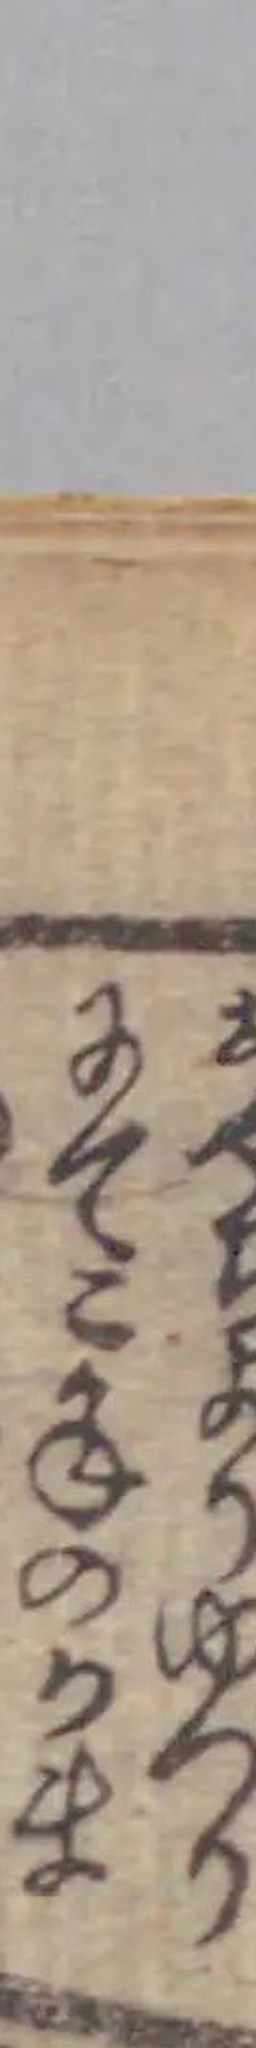にてこかねのかま
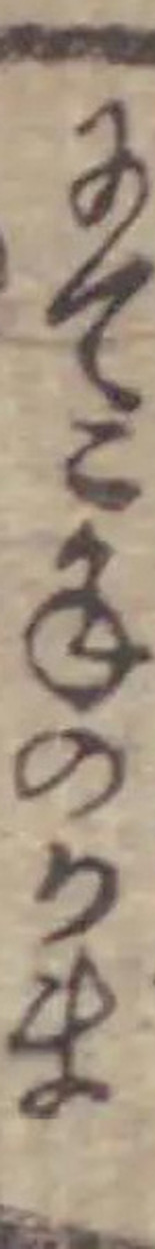にてこかねのかま
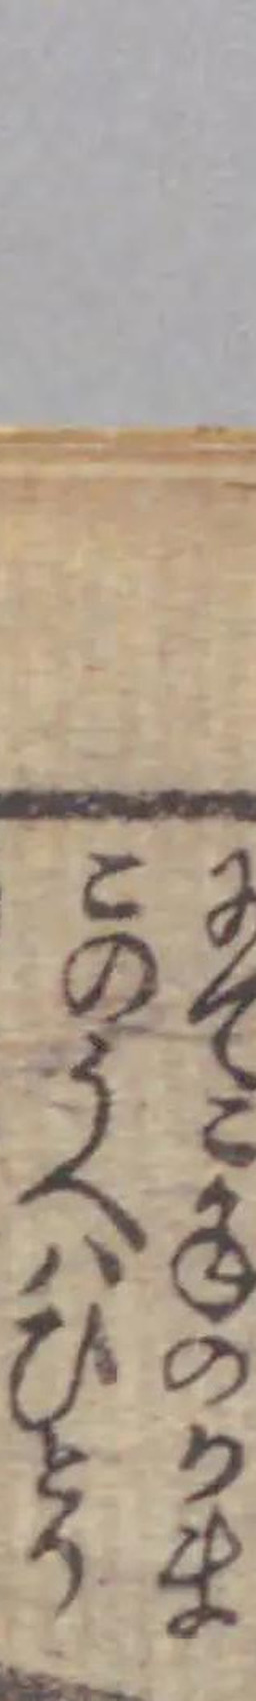このうへはひとり
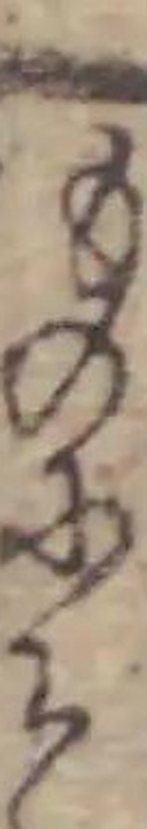ものにて
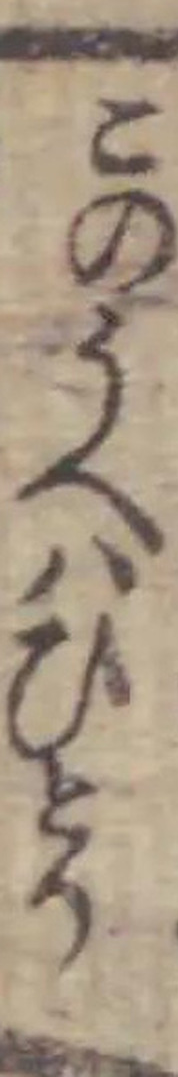このうへはひとり
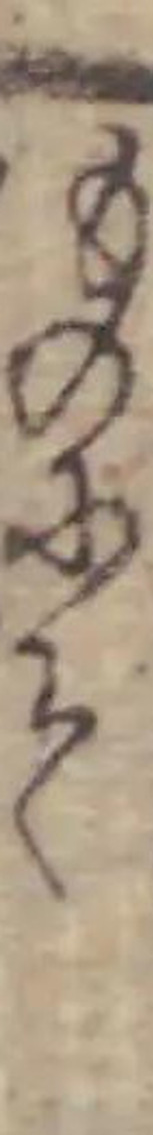ものにて
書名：間違月夜鍋 2巻
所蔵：国立国会図書館 National Diet Library, JAPAN
